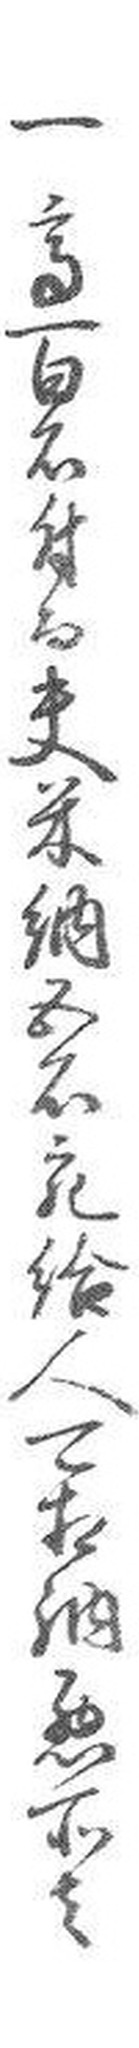一高百石付而夫米納五石宛給人可相納悪所者
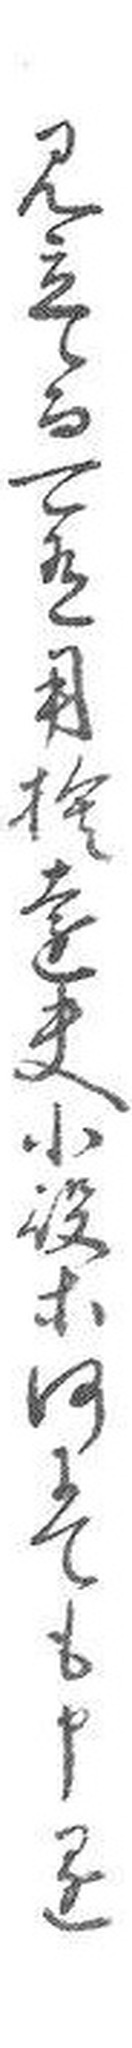見立候而可有用捨遠夫小役等何にても申懸
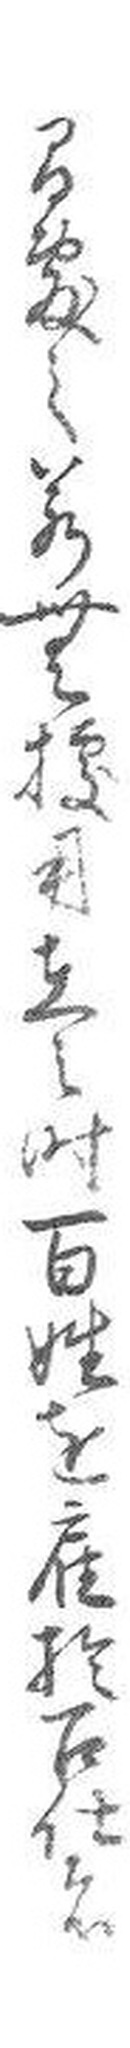間敷之若無拠用在之時百姓を雇於召仕者
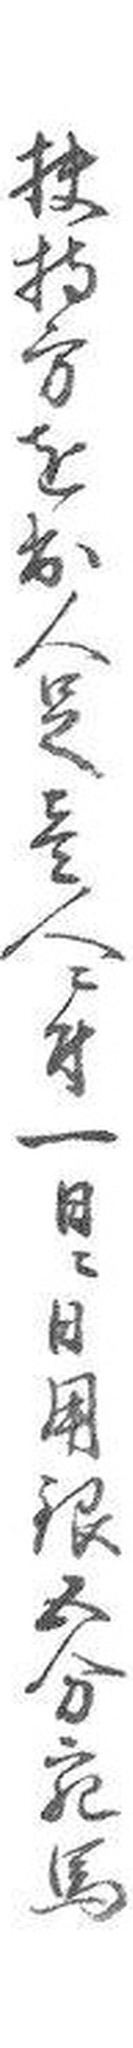扶持方を出人足壱人ニ付一日ニ日用銀五分宛馬
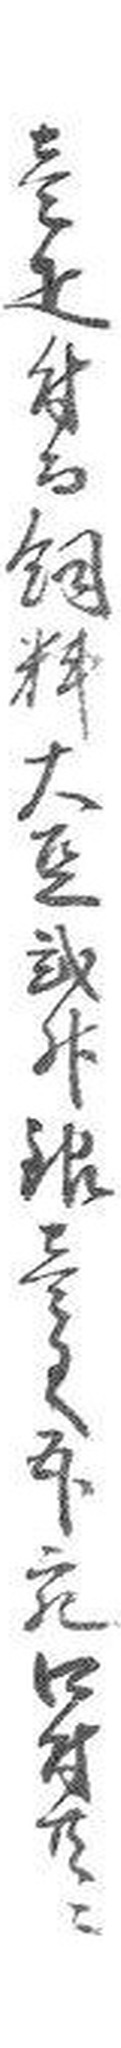壱疋付而飼料大豆弐升銀壱匁五分宛口付共ニ
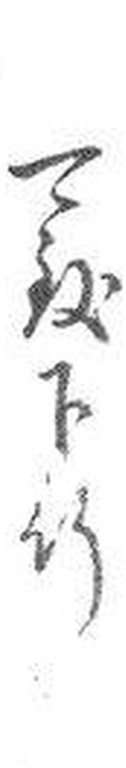可致下行
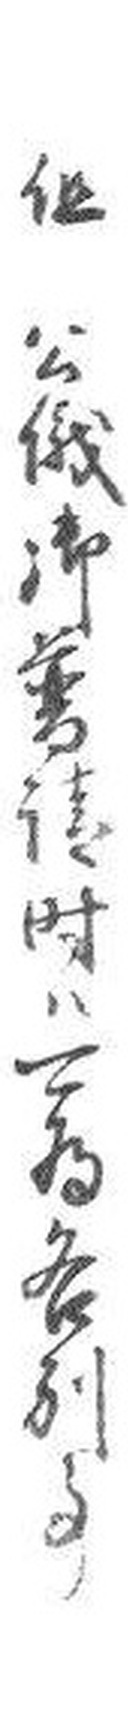但公儀御普請時ㇵ可為各別事
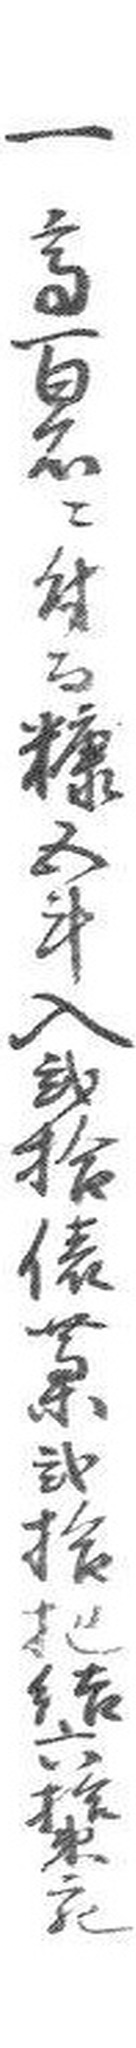一高百石ニ付而糠五斗入弐拾俵藁弐拾把詰六拾束宛
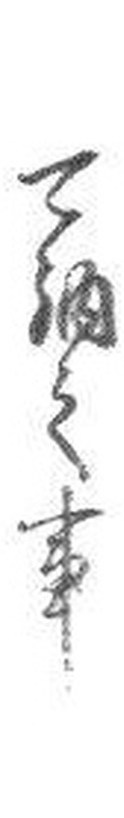可納之事
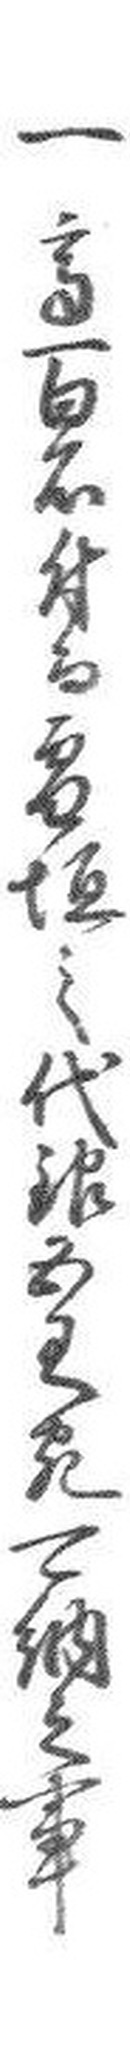一高百石付而雪垣之代金五匁宛可納之事
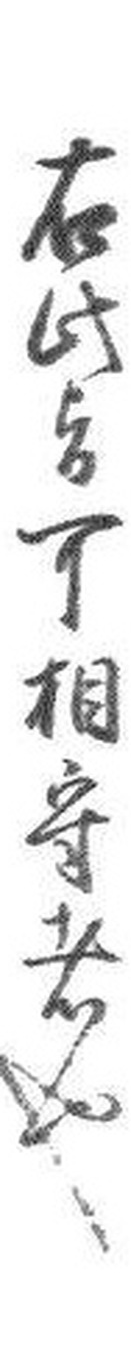右此旨可相守者也
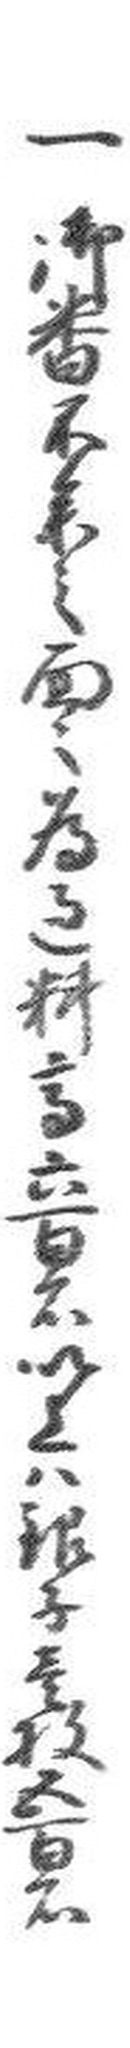一御番不参之面々為過料高六百石以上ㇵ銀子壱枚五百石
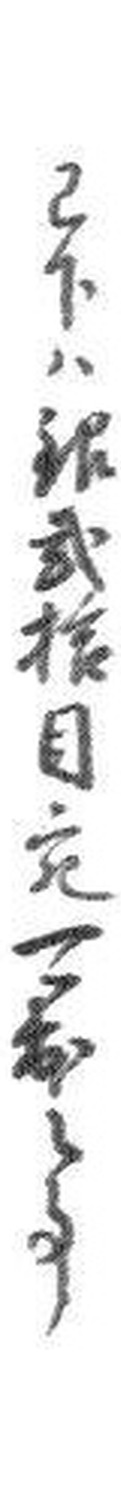已下ㇵ銀弐拾目宛可出候事
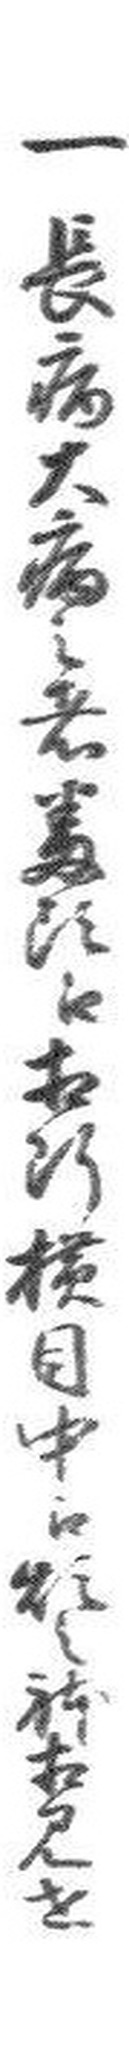一長病大病之者番頭江相断横目中江煩之体相見せ
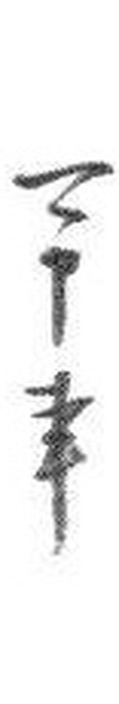可申事

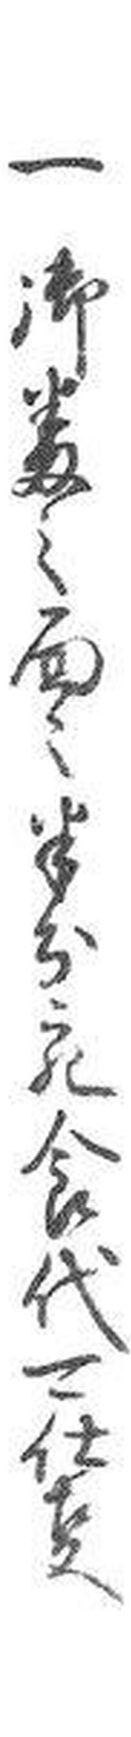一御番之面々半分宛食代可仕事
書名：家譜 五 光通公 従寛永十三年到万治二年
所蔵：福井県文書館 Fukui Prefectural Archives
